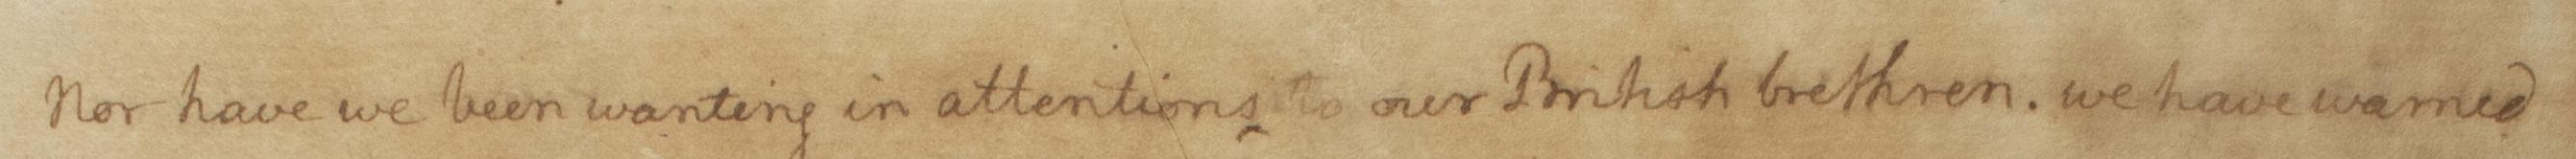Nor have we been wanting in attentions to our British brethren. we have warned
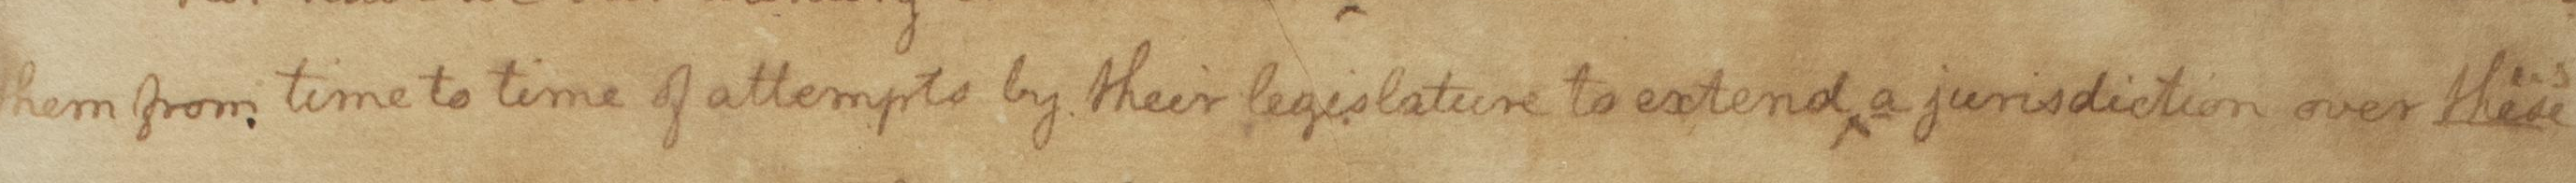them from time to time of attempts by their legislature to extend a jurisdiction over these
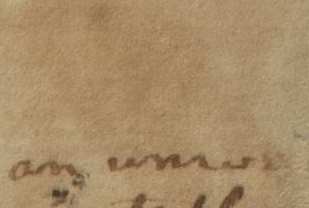an uncom-
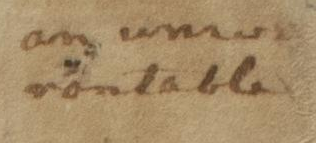-fortable
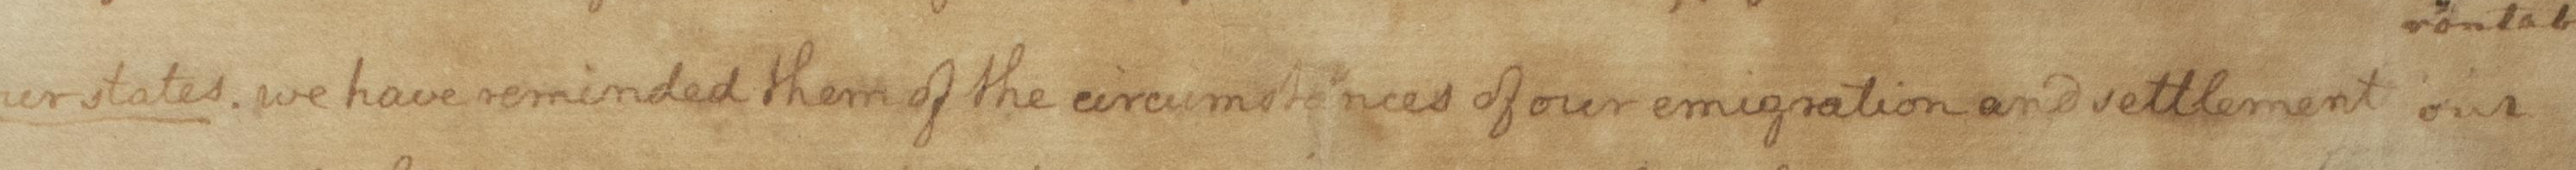or states. we have reminded them of the circumstances of our emigration and settlement our
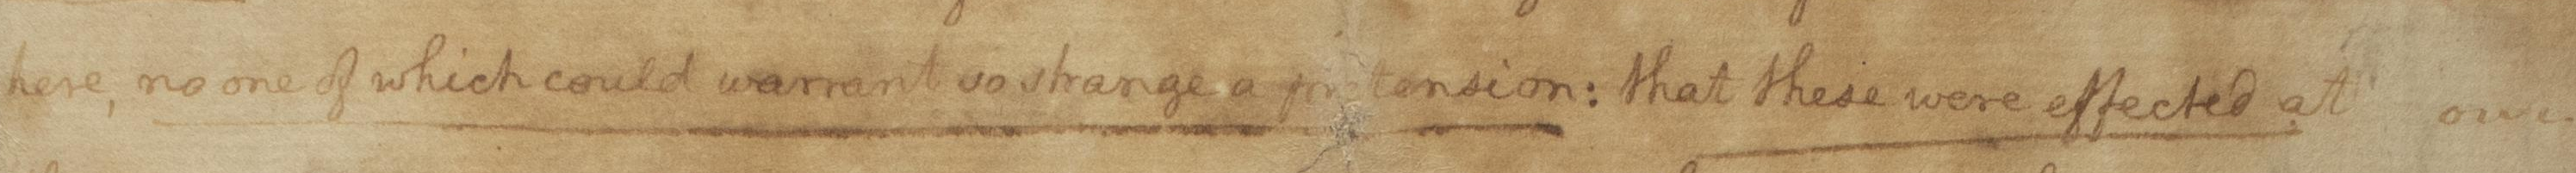here, no one of which could warrant so strange a pretension: that these were effected at our
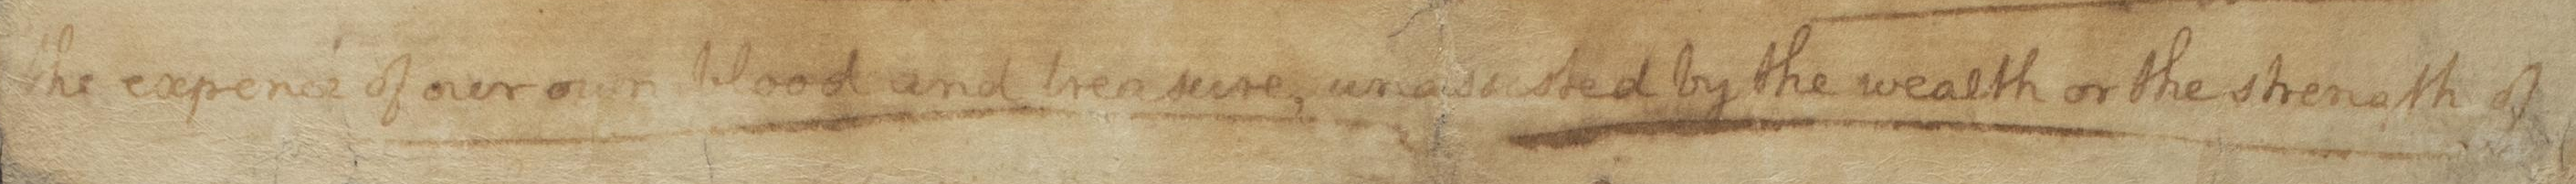the expense of our own blood and treasure unassisted by the wealth or the strength of
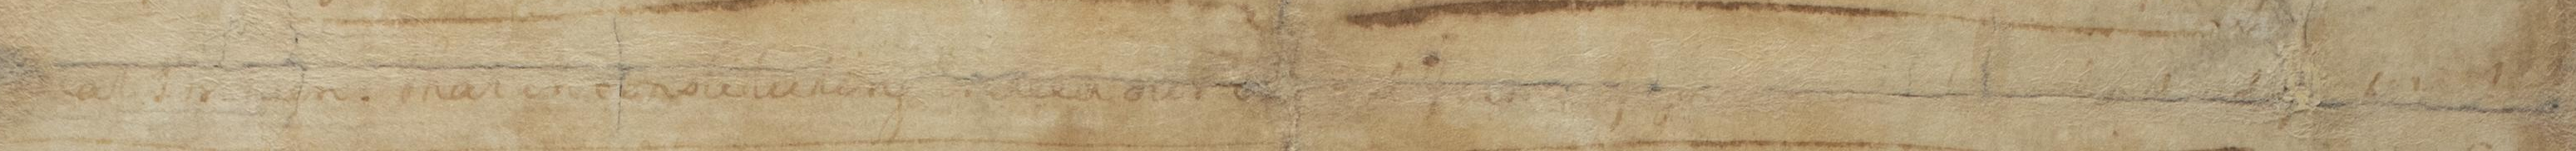Great Britain: that in constituting indeed our several forms of government, we had adop
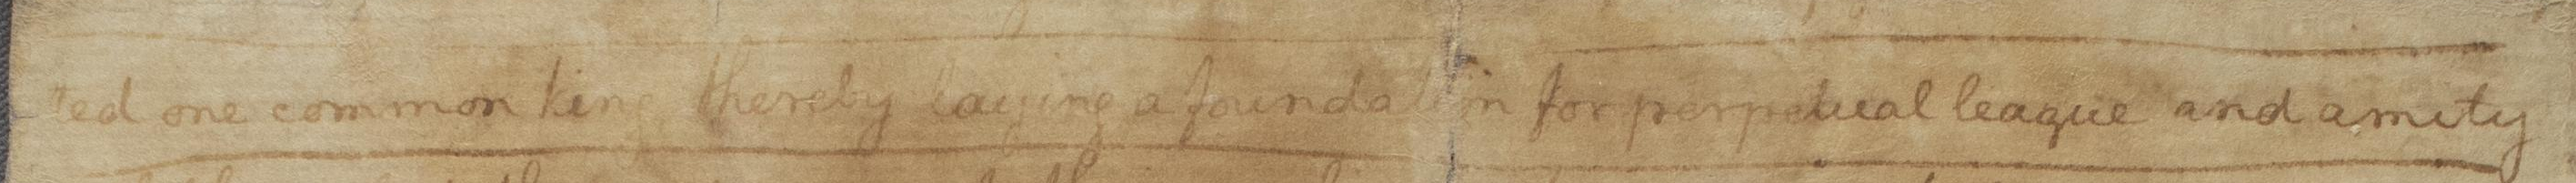-ted one common king hereby laying a foundation for perpetual league and amety
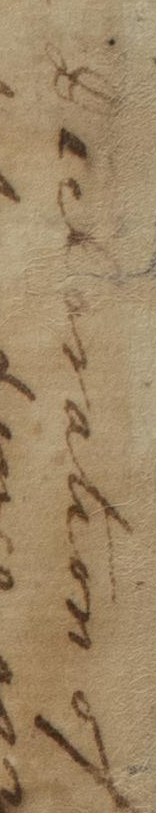Declaration of
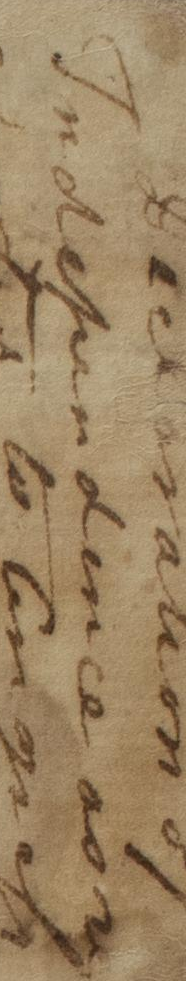independence as ex
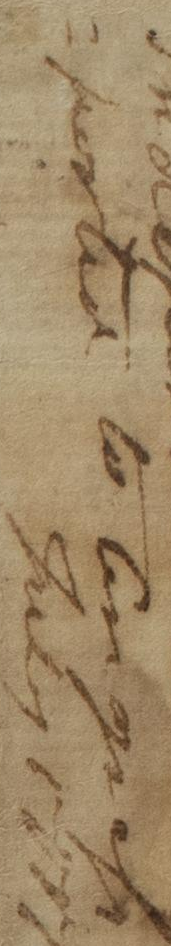-pected to Congress of
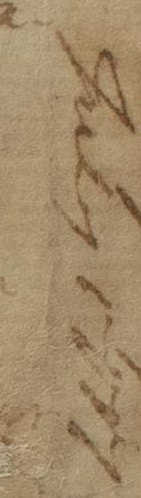July 1777
